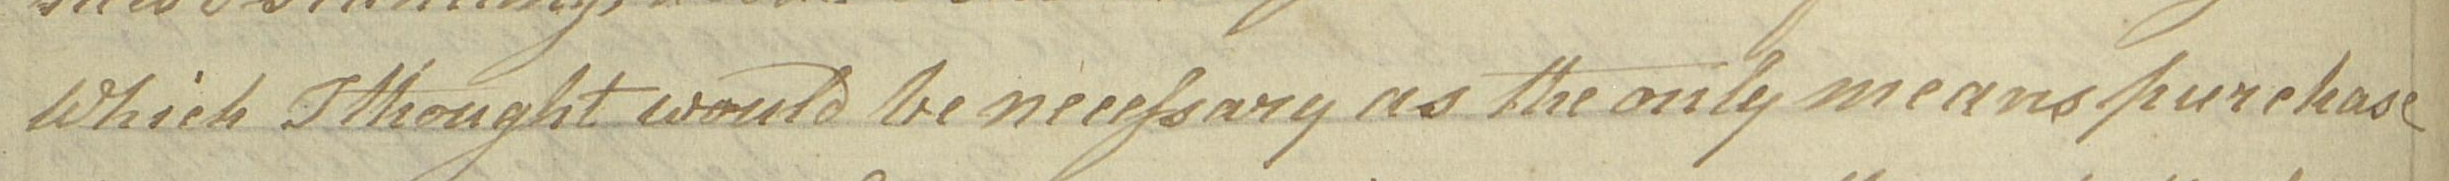Which I thought would be necessary as the only means purchase
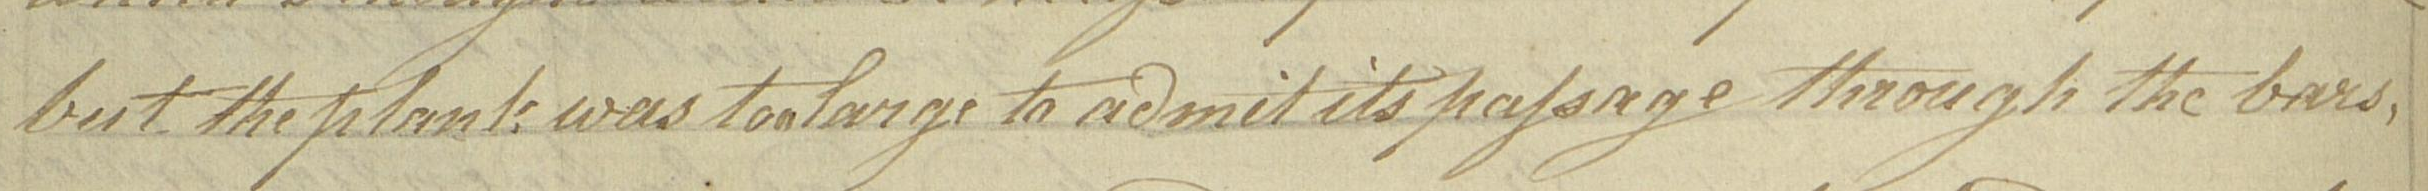but the plank was too large to admit its passage through the bars,
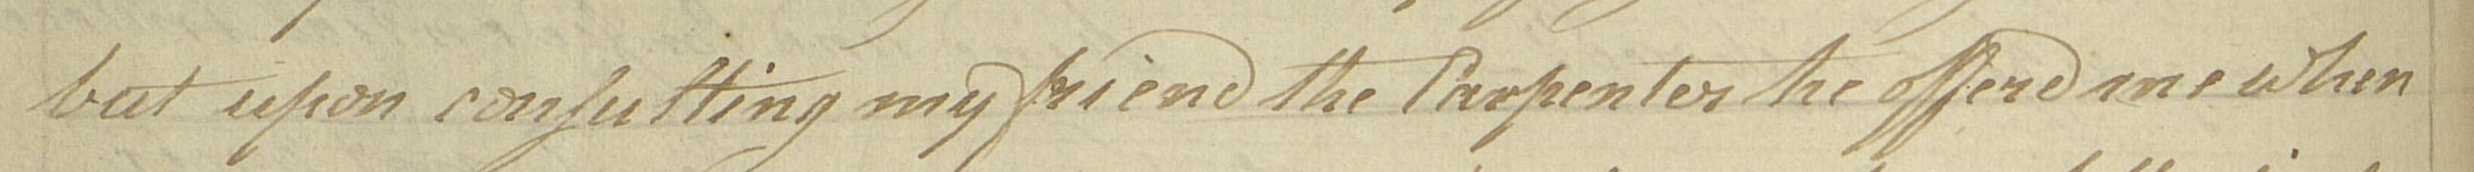but upon consulting my friend the Carpenter he offered me when
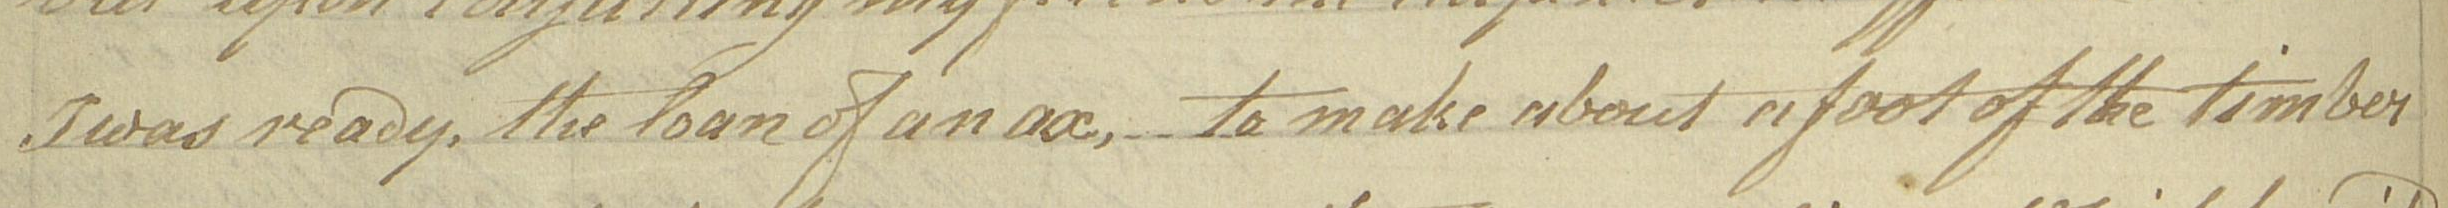I was ready, the loan of an ax, to make about a foot of the timber
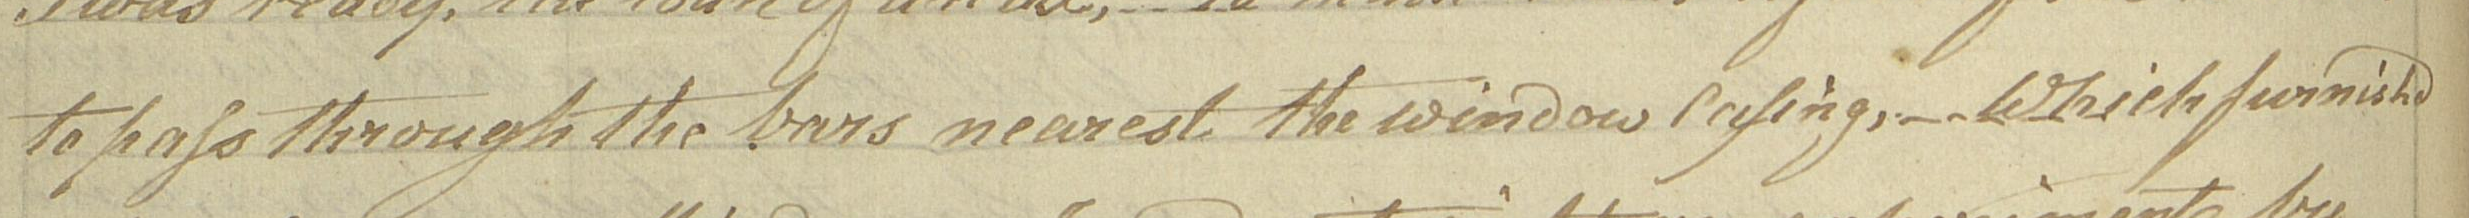to pass through the bars nearest the window Crying, Which furnishd
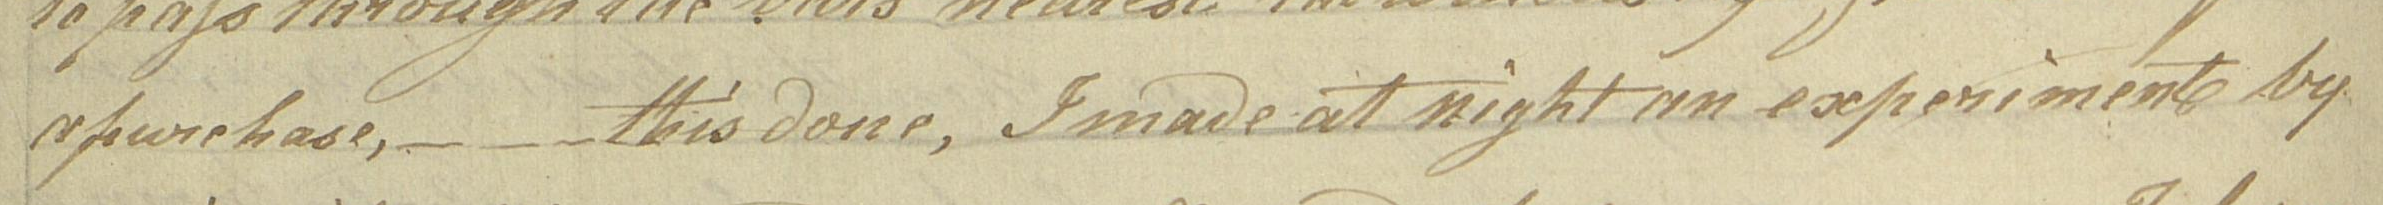a purchase, this done, I made at night in experiment by
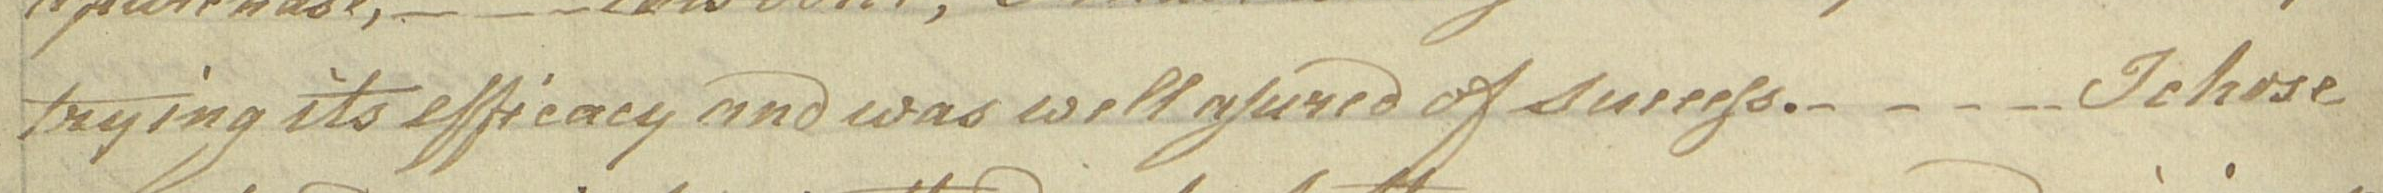trying its efficacy and was well asured of suuccess. I chose
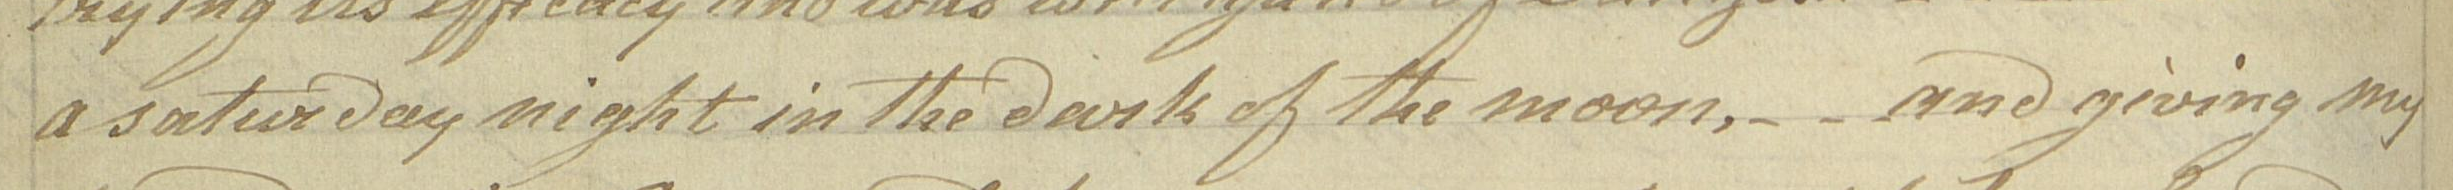a saturday night in the dark of the moon, and giving my
